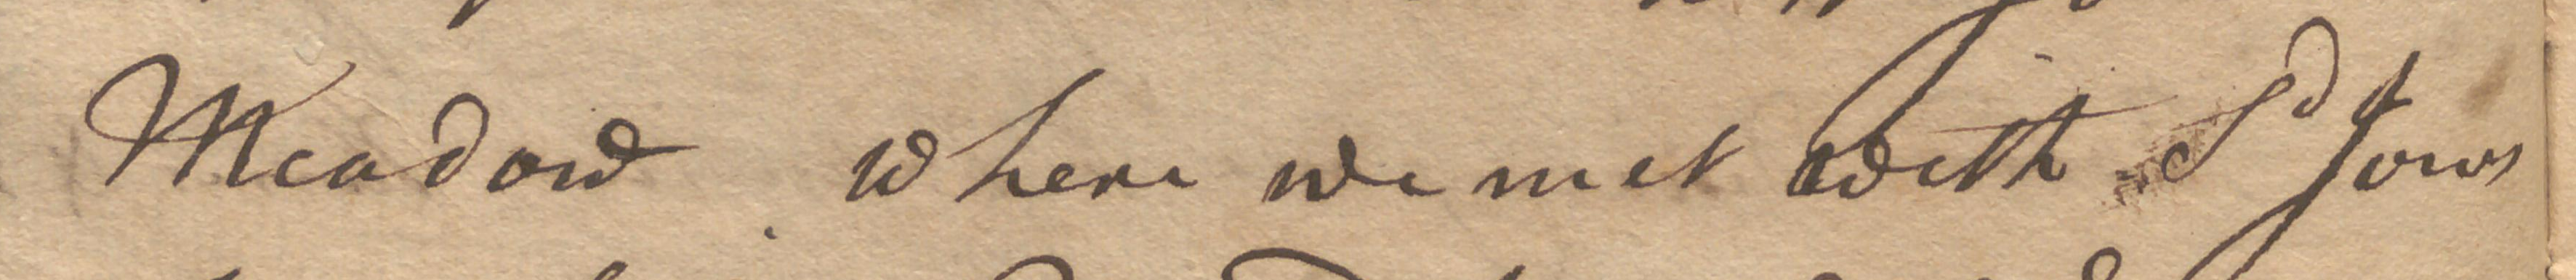Meadow where we met with s^d Jones
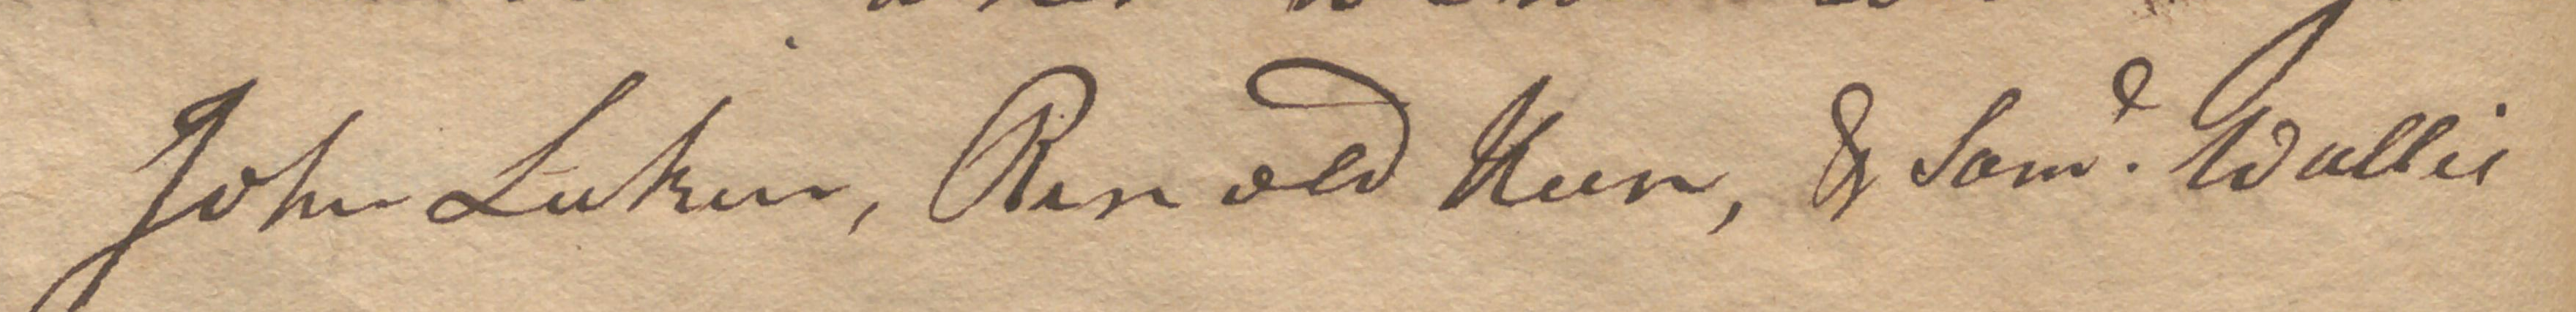John Lukens, Renold Kun, & Sam^l. Wallis
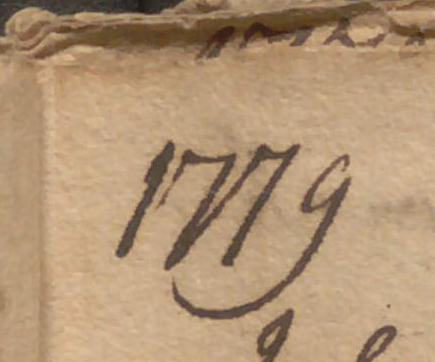1779
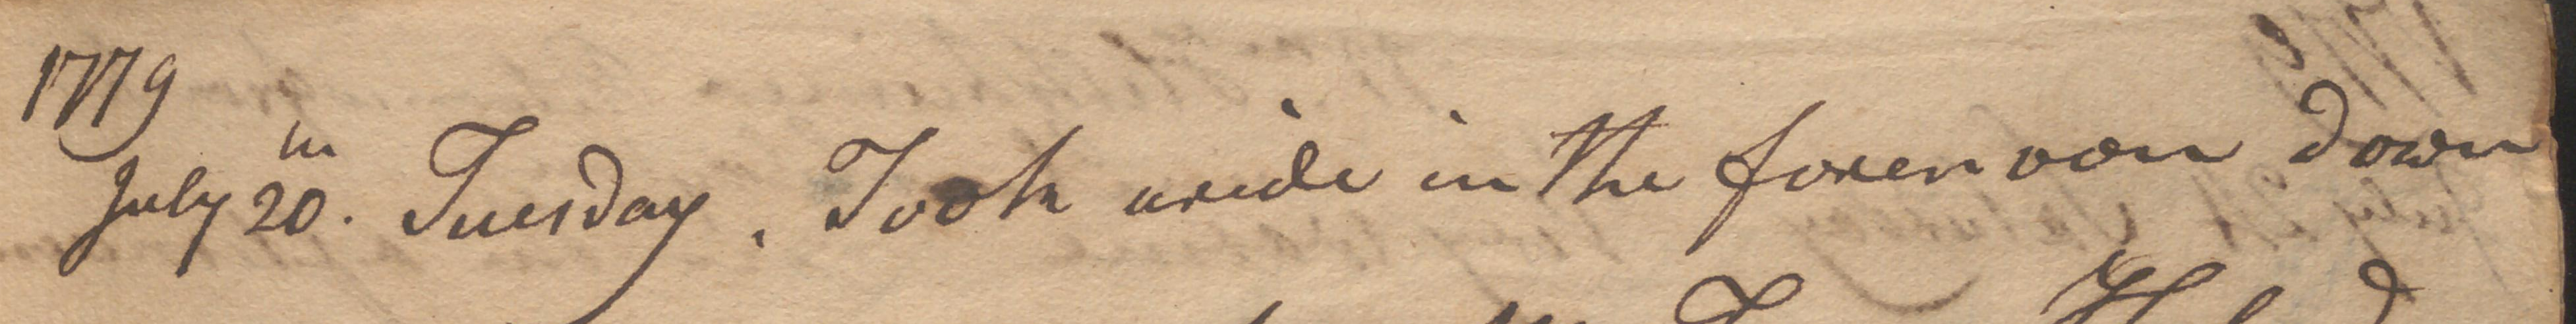July 20^th. Tuesday, Took a ride in the forenoon down
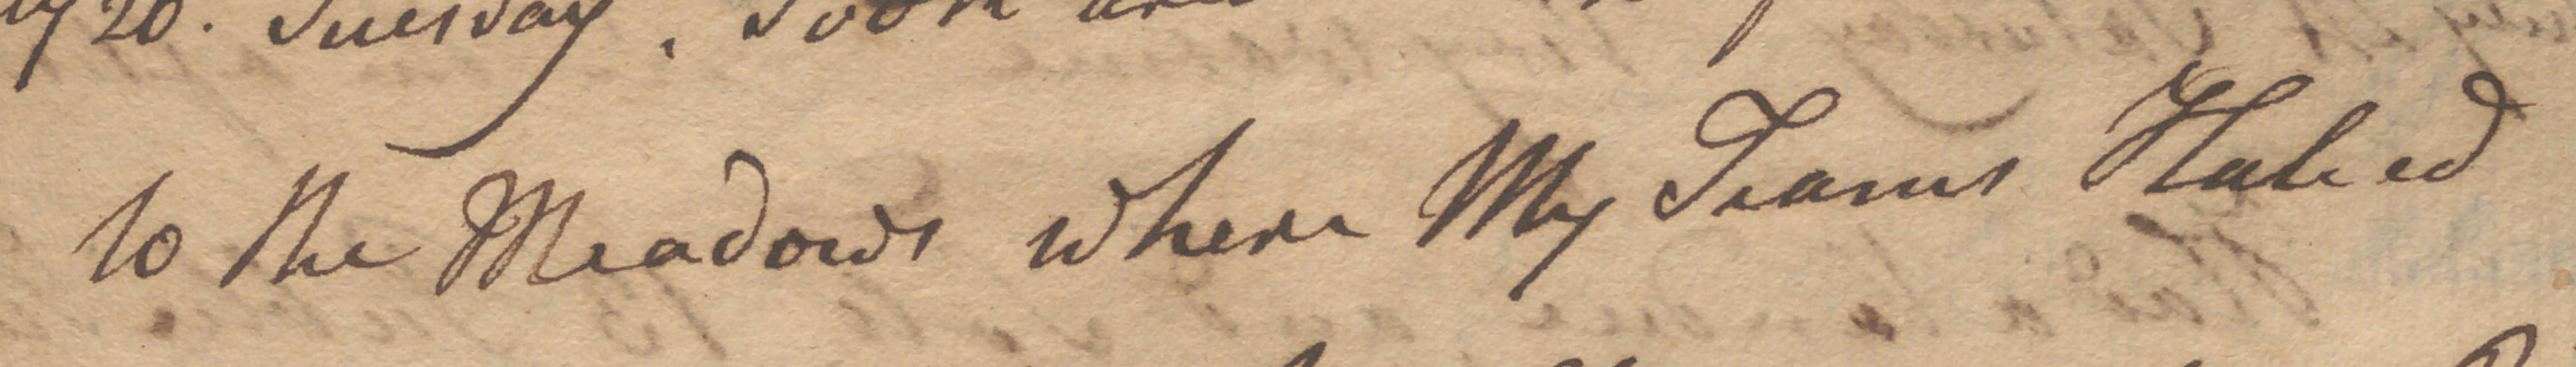to the Meadows where My Teams Haled
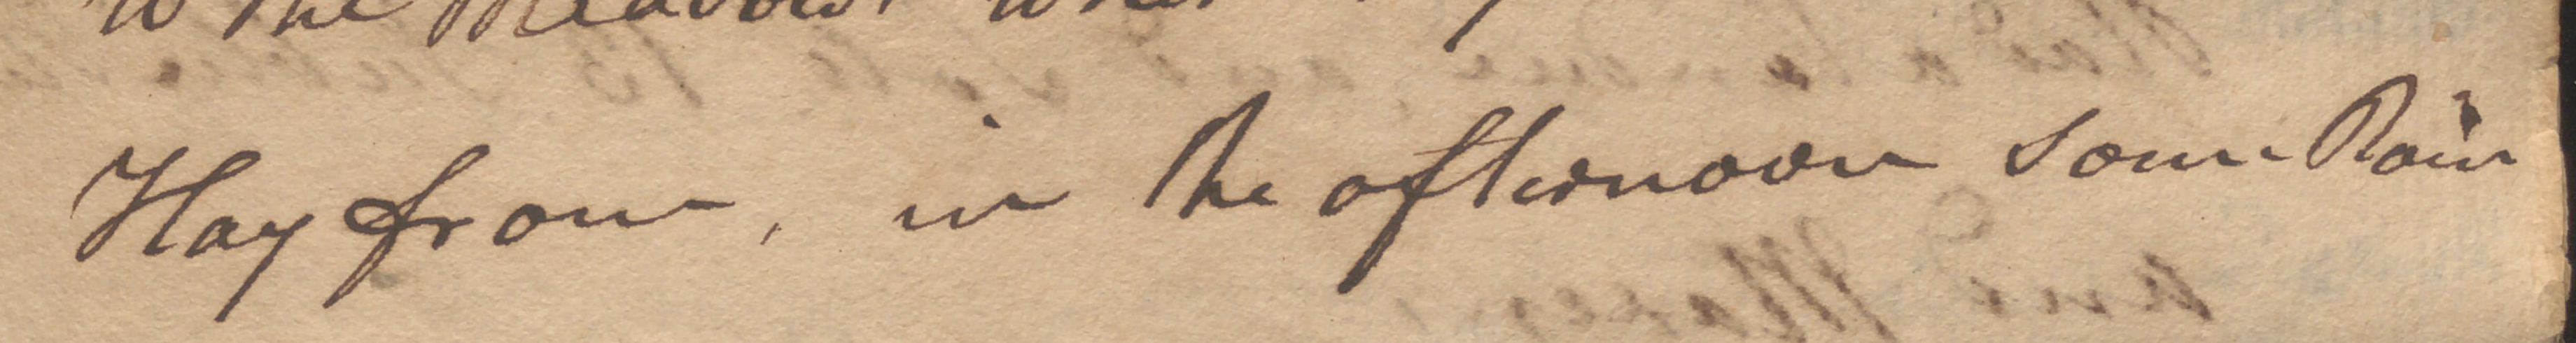Hay from, in the afternoon some Rain
